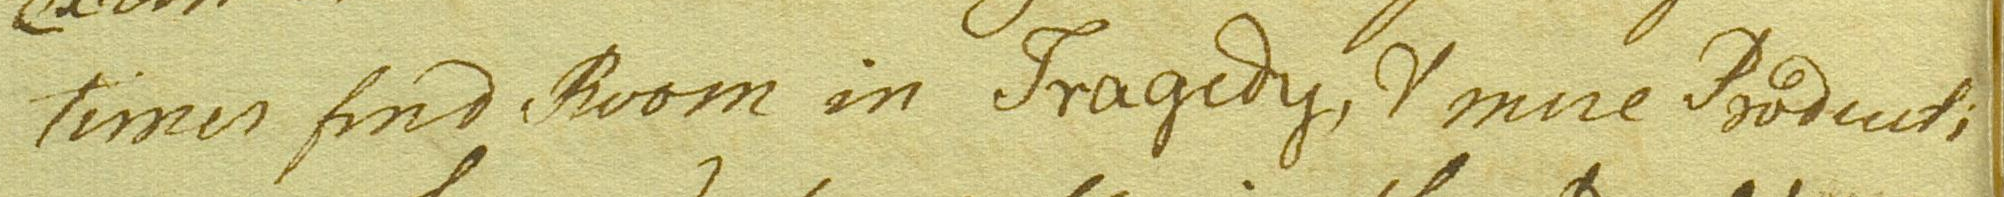times find Room in Tragedy, & mere Producti
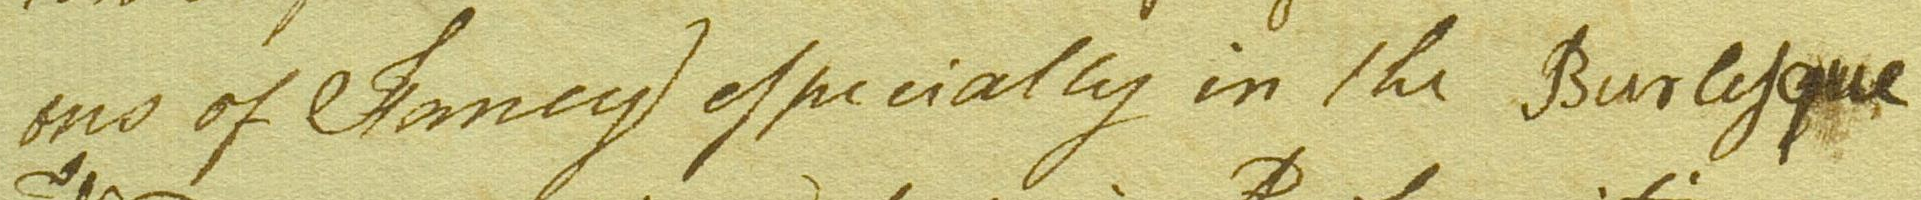ons of Fancy especially in the Burlesque
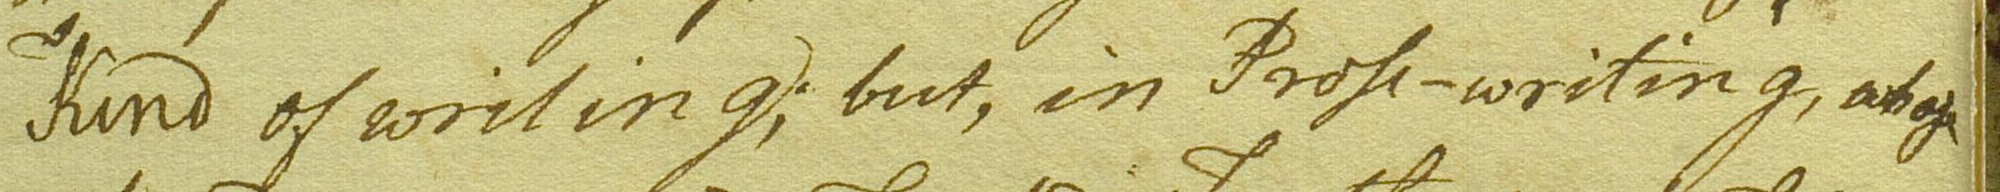Kind of writing; but, in Prose-writing, a [___]
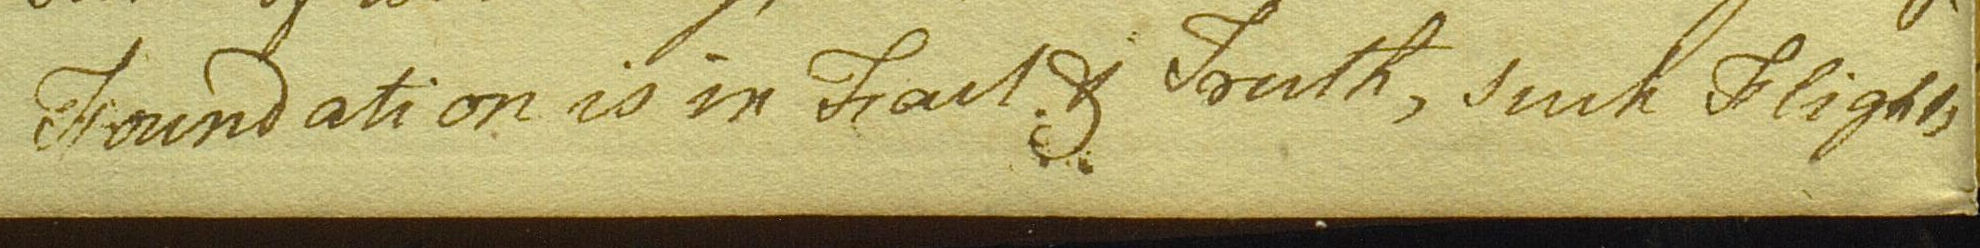Foundation is in Fact & Truth, such Flights
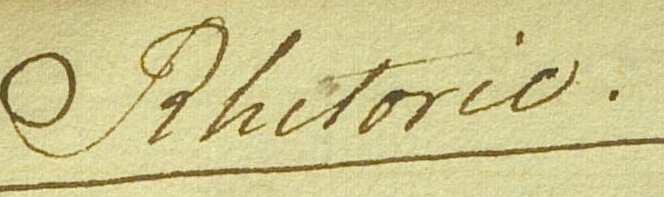Rhetoric
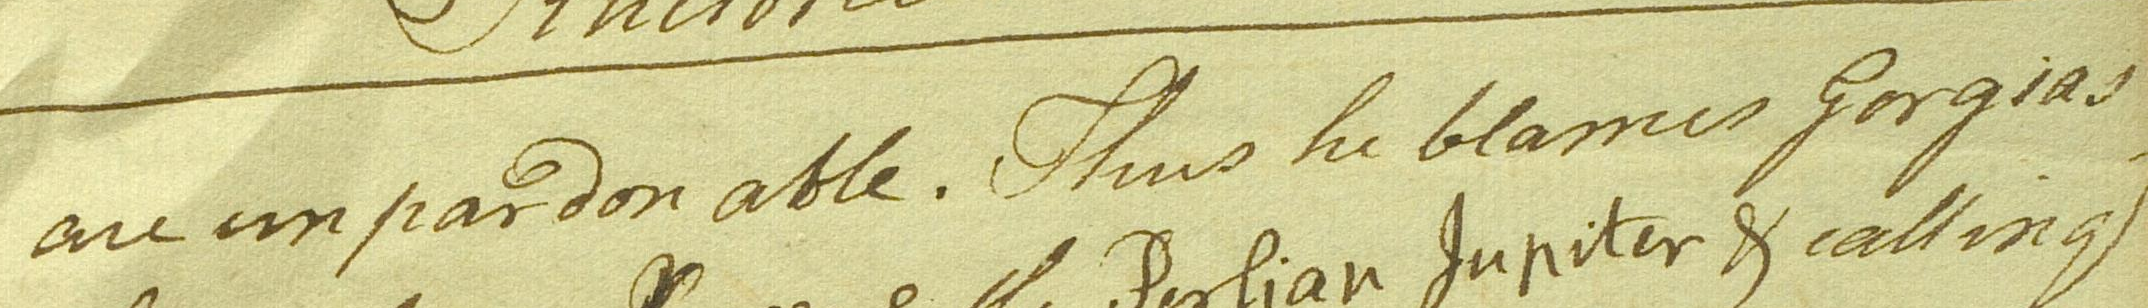are unpardonable. Thus he blames Gorgias
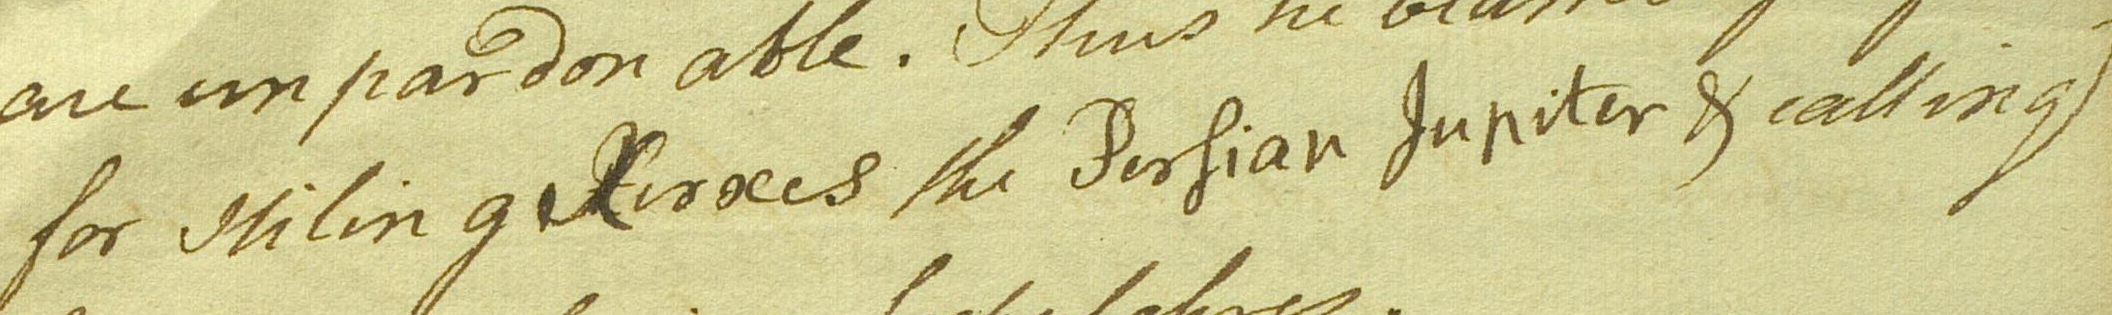for stiling Xerxes the Persian Jupiter & calling
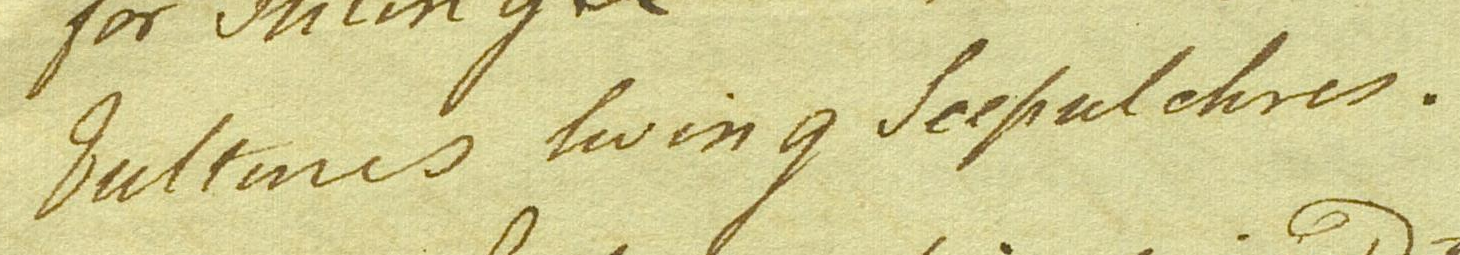Vultures living Scepulchres.
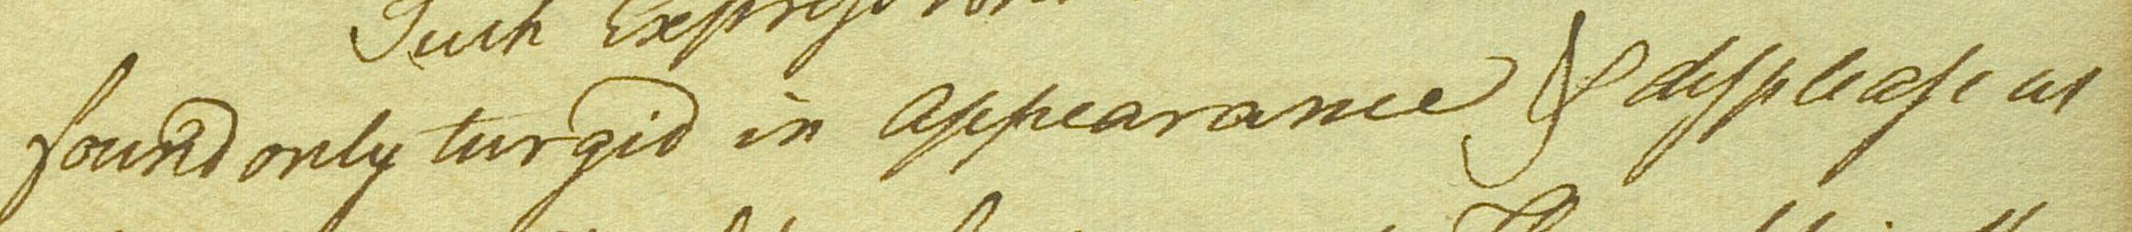found only turgid in appearance & displease us
